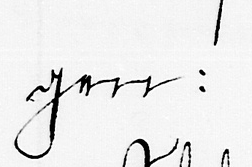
gen:
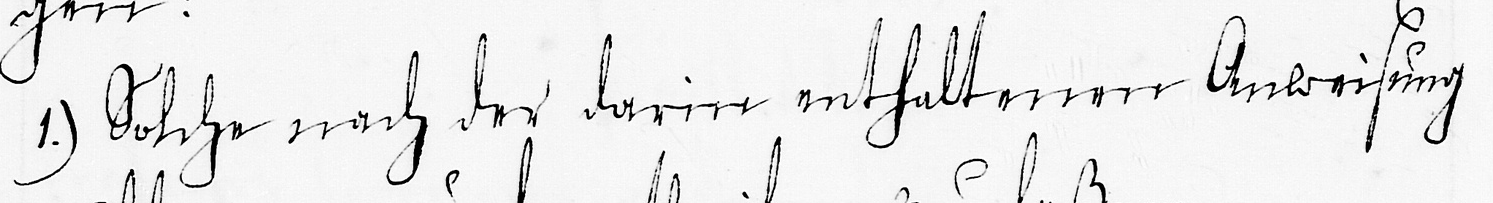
1.) Solche nach der darin enthaltenen Anweisung
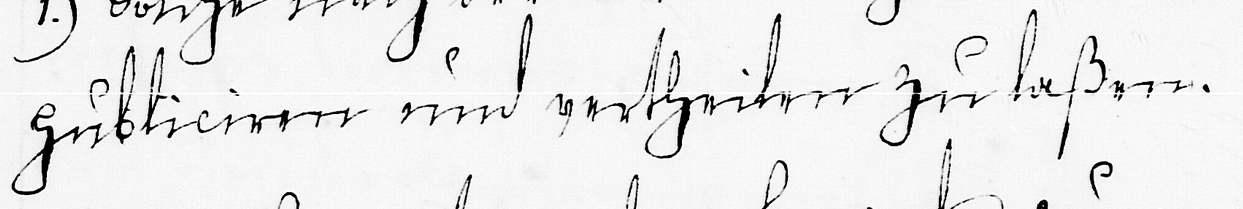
publiciren und vertheilen zu laßen.
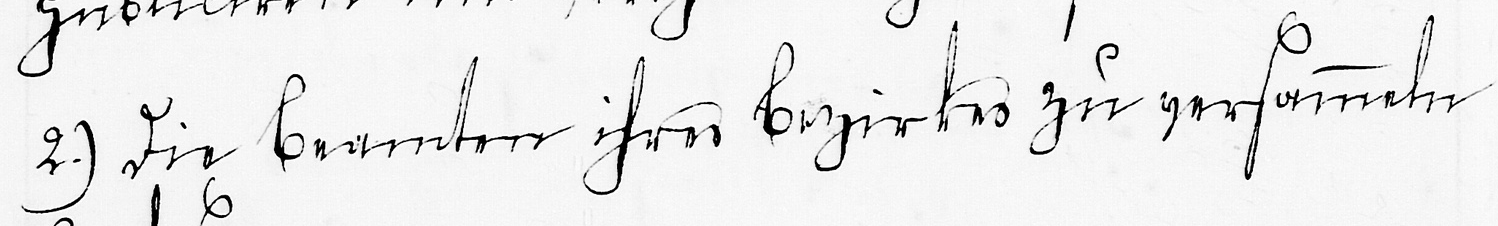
2.) Die Beamten ihres Bezirkes zu versammeln
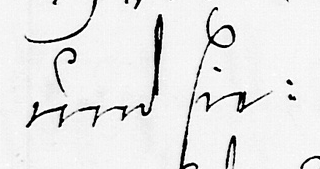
und sie:
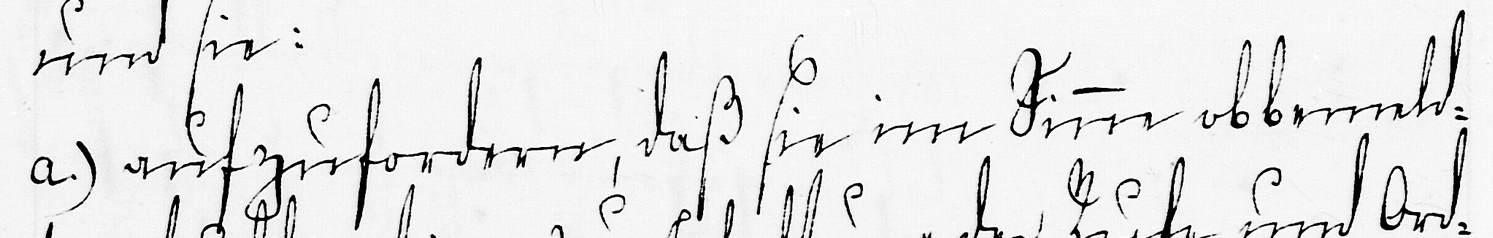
a.) aufzufordern, daß sie im Sinne obbemeld¬
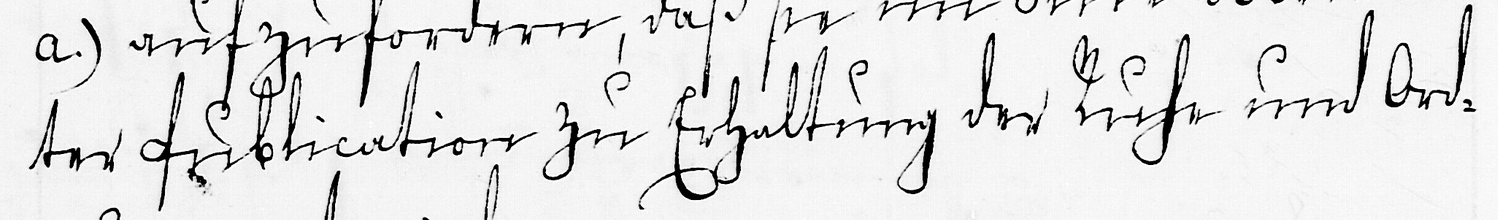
ter Publication zu Erhaltung der Ruhe und Ord¬
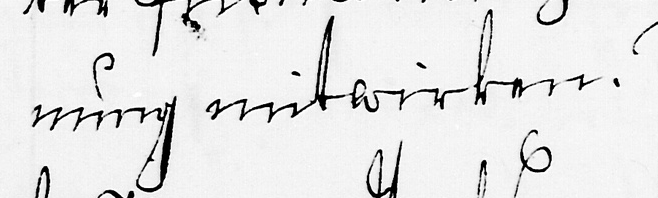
nung mitwirken.
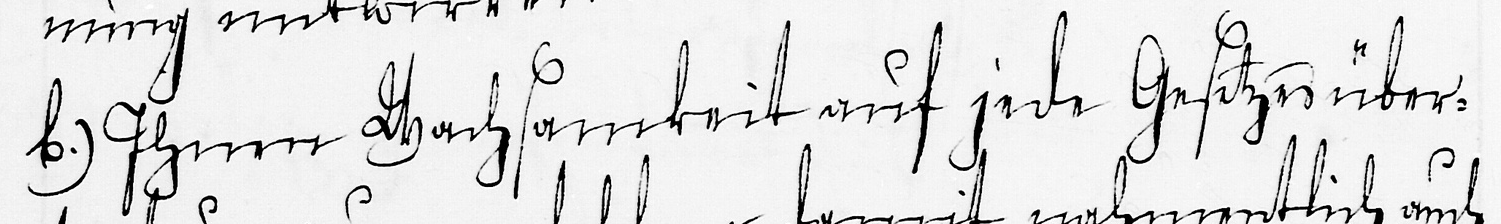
b.) Ihnen Wachsamkeit auf jede Gesetzesüber¬
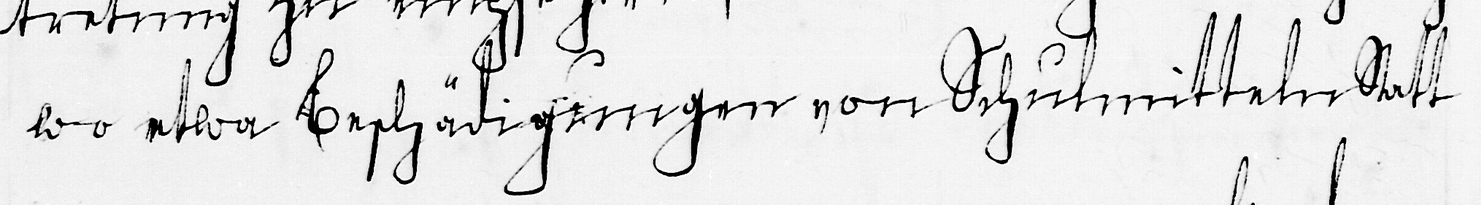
wo etwa Beschädigungen von Schulmitteln Statt
